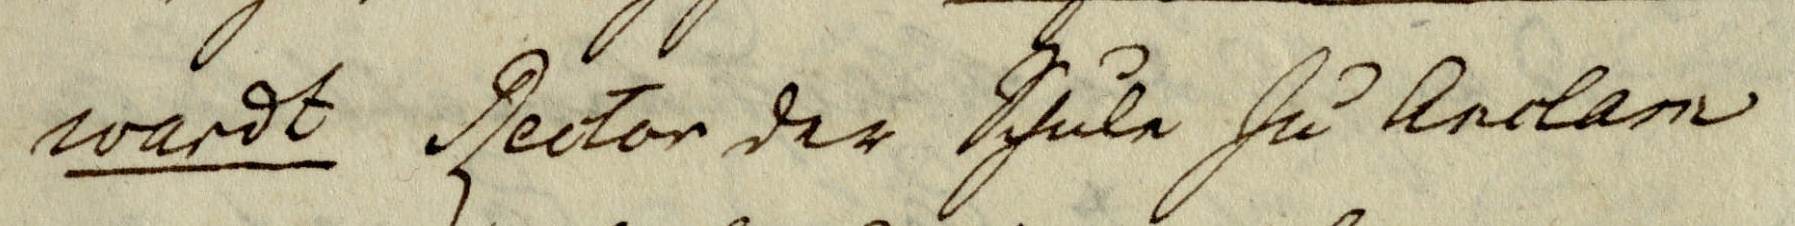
wardt Rector der Schule zu Anclam
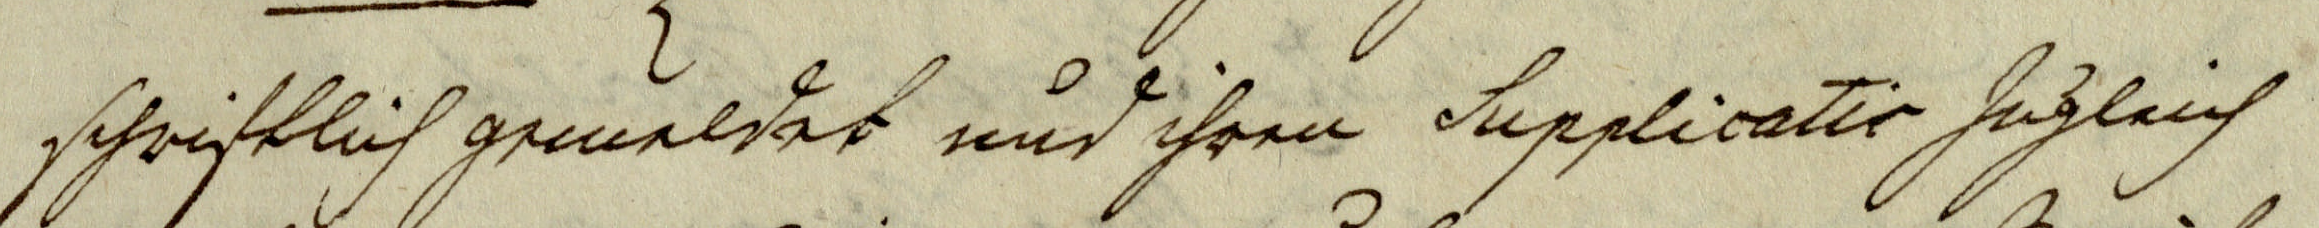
schriftlich gemeldet und ihren Supplicatis zugleich
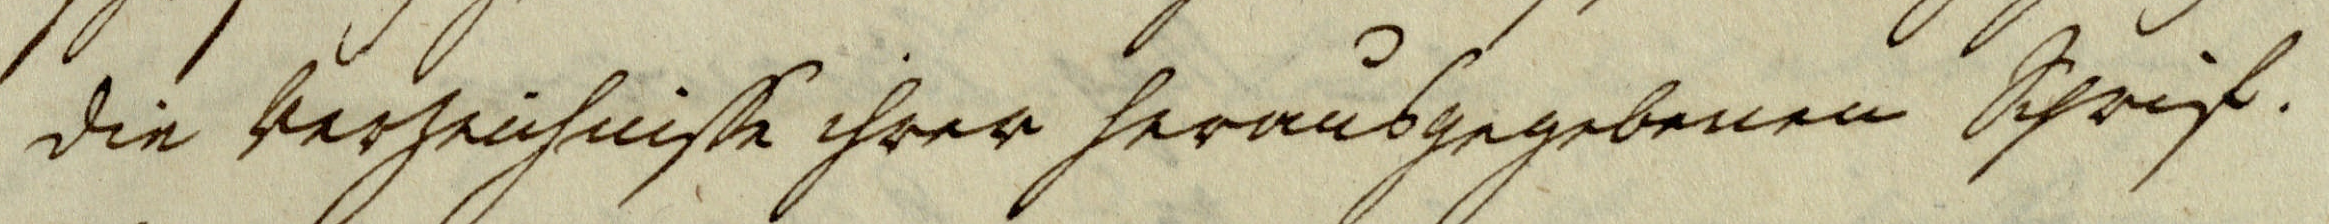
die Verzeichnisse ihrer herausgegebenen Schrif¬
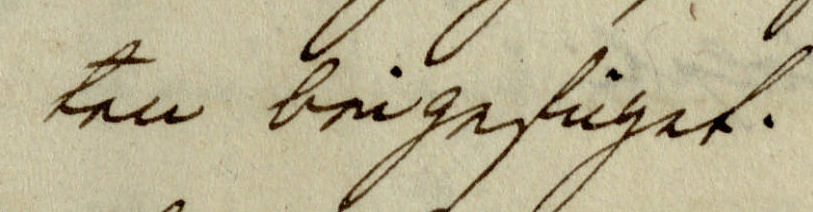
ten beigefüget.
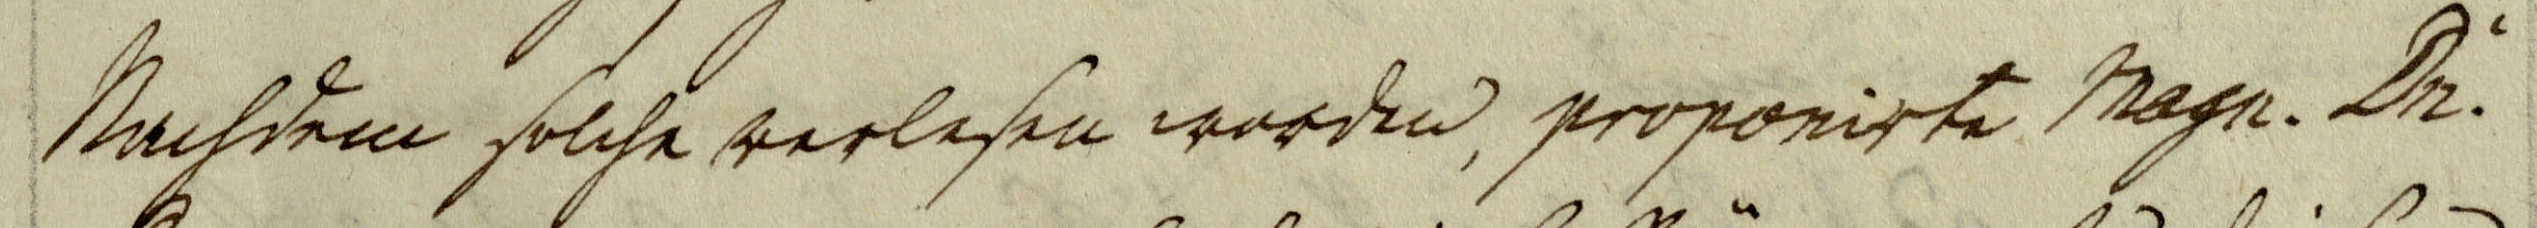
Nachdem solche verlesen worden, proponirte Magn. Dn.
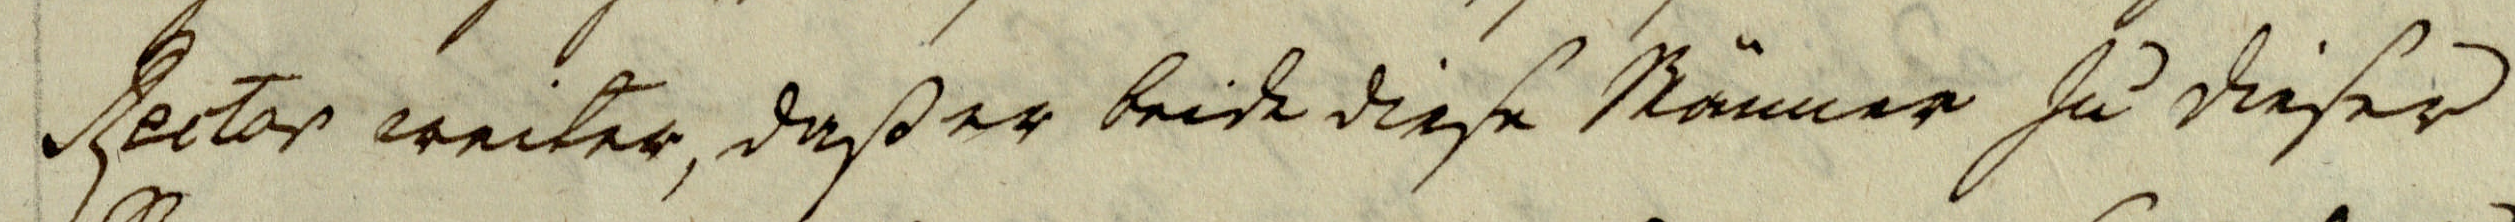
Rector weiter, daß er beide diese Männer zu dieser
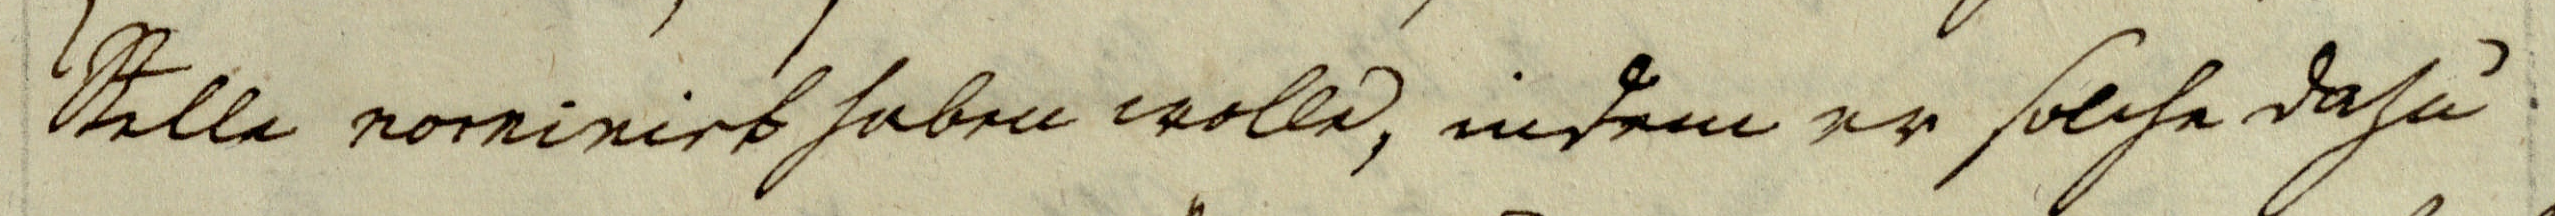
Stelle nominirt haben wolle, indem er solche dazu
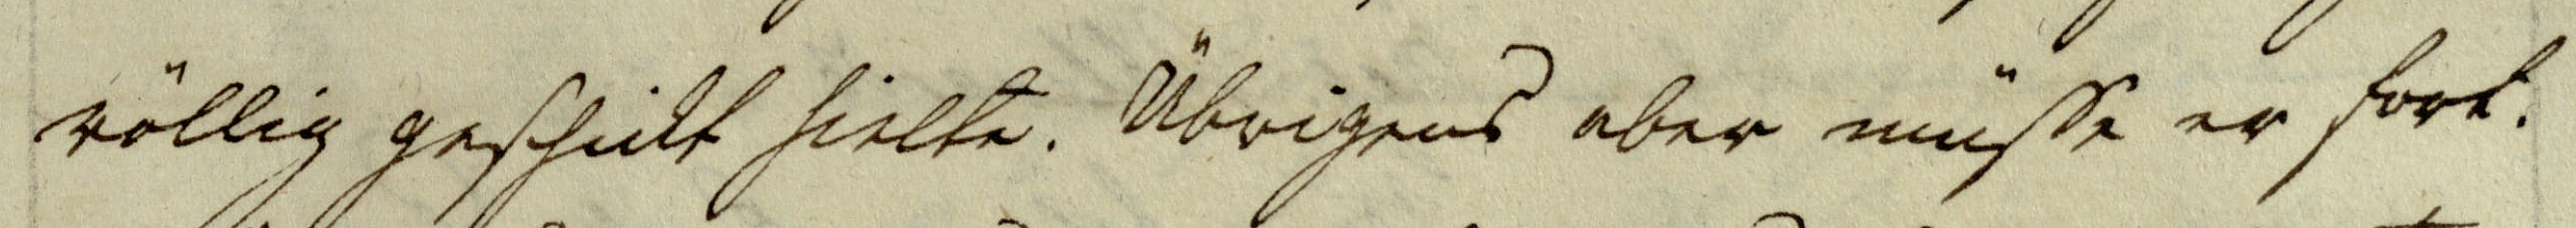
völlig geschickt hielte. Übrigens aber müsse er fort¬
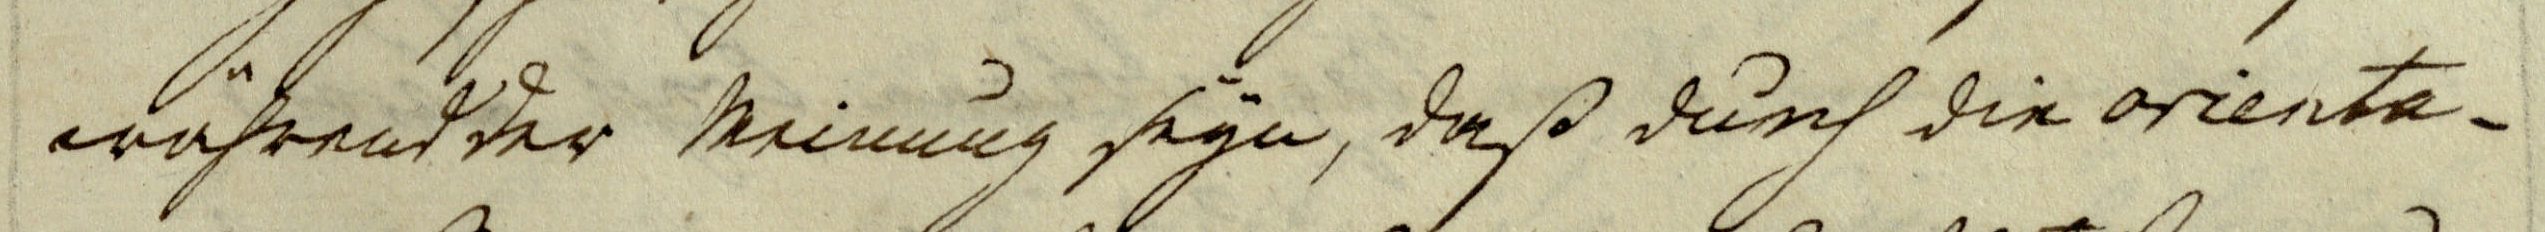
während der Meinung seÿn, daß durch die orienta¬
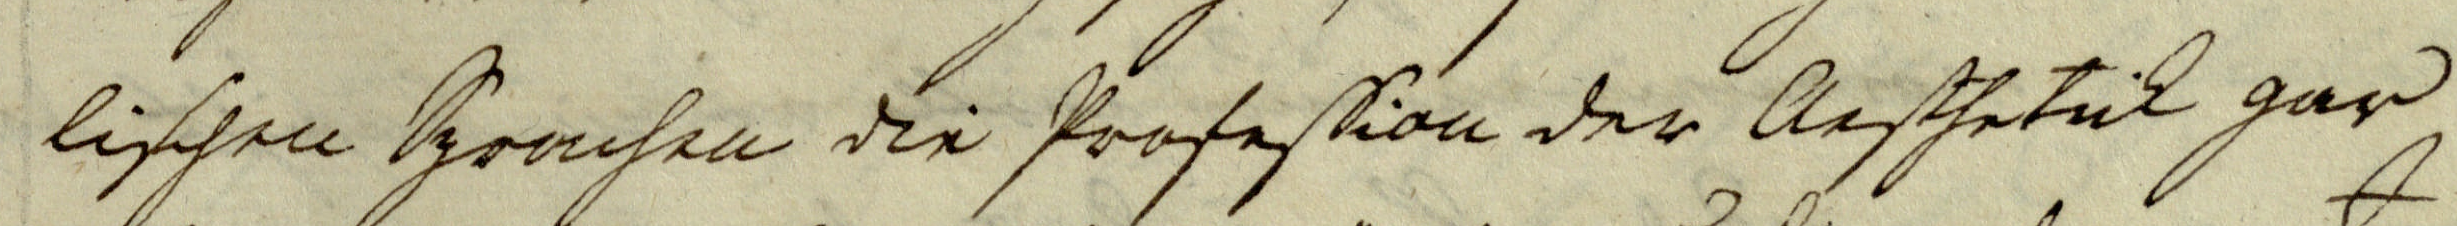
lischen Sprachen die Profession der Aesthetick gar
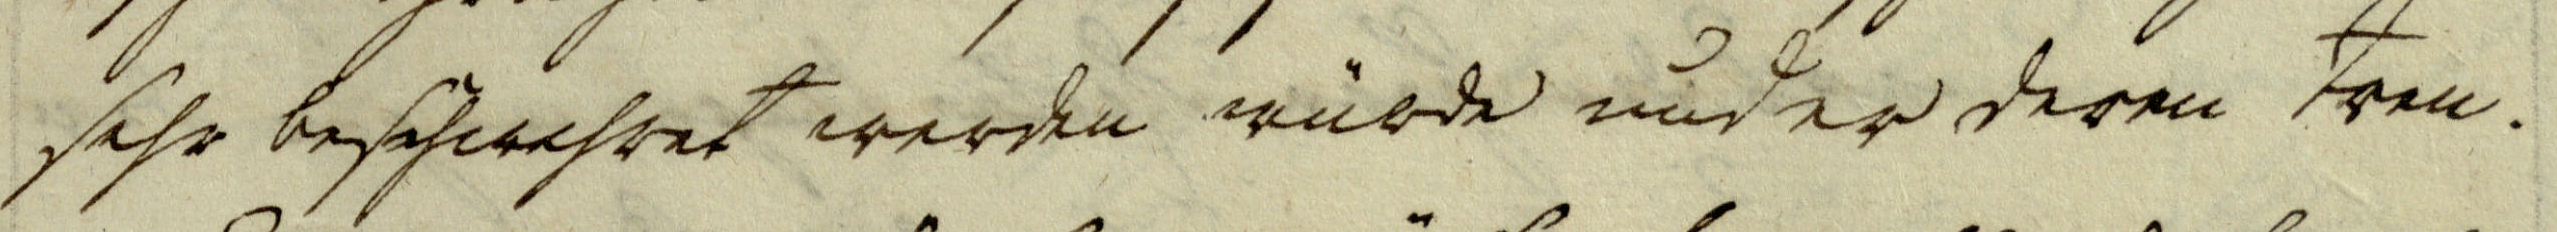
sehr beschwehret werden würde und er deren Tren¬
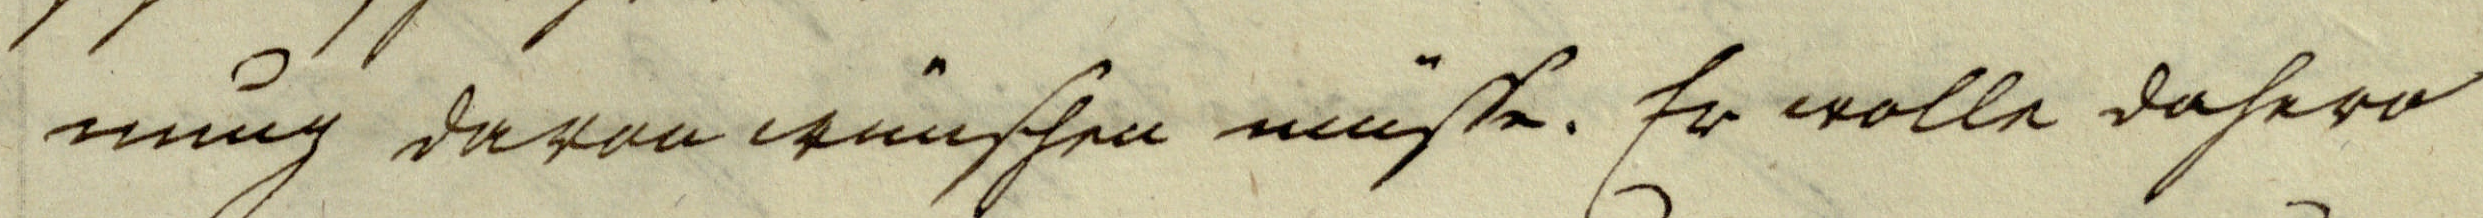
nung davon wünschen müsse. Er wolle dahero
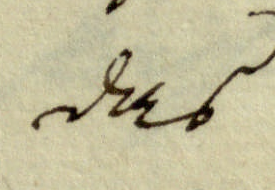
das
